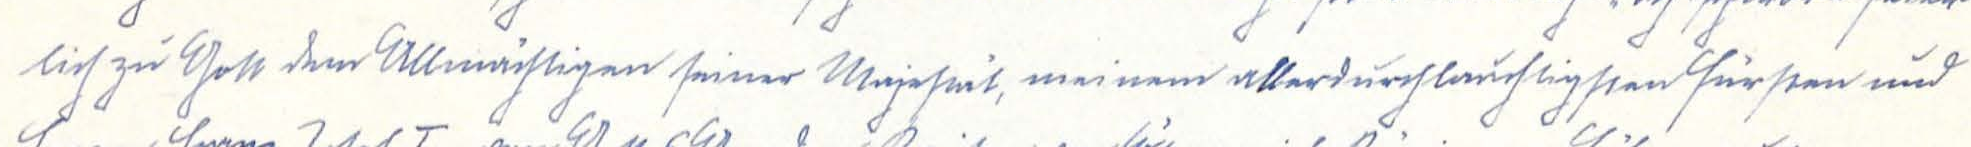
lich zu Gott dem Almlächtigen seiner Majestät, meinem allerdurchlauchtigsten Fürsten und
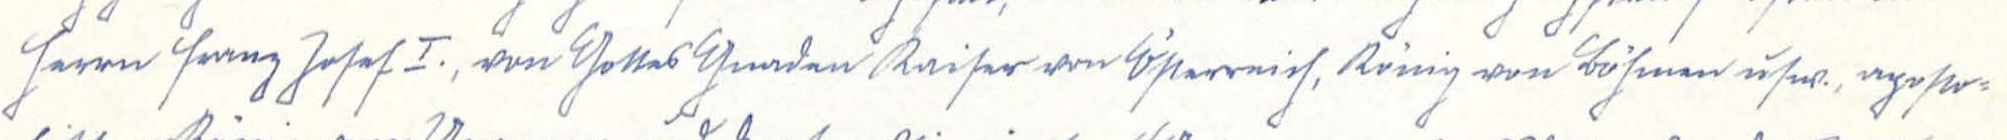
Herrn Franz Josef I., von Gottes Gnaden Kaiser von Österreich, König von Böhmen usw.,aposto-
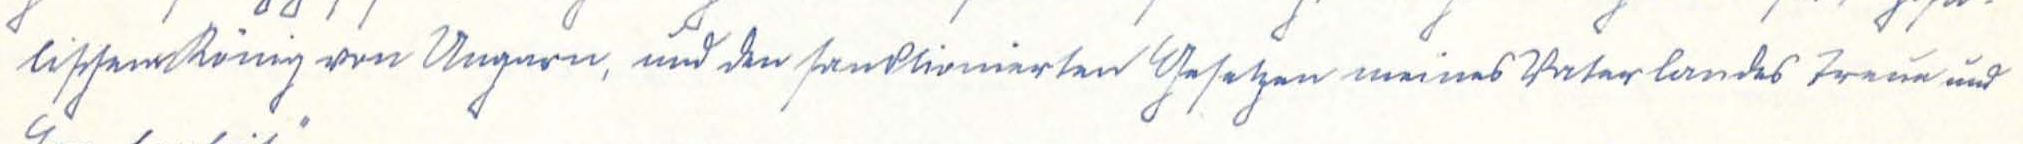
lischer König von Ungarn, und den sanktionierten Gesetzen meines Vaterlandes Treue und
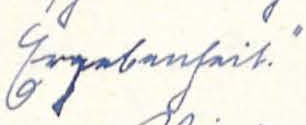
Ergebenheit."
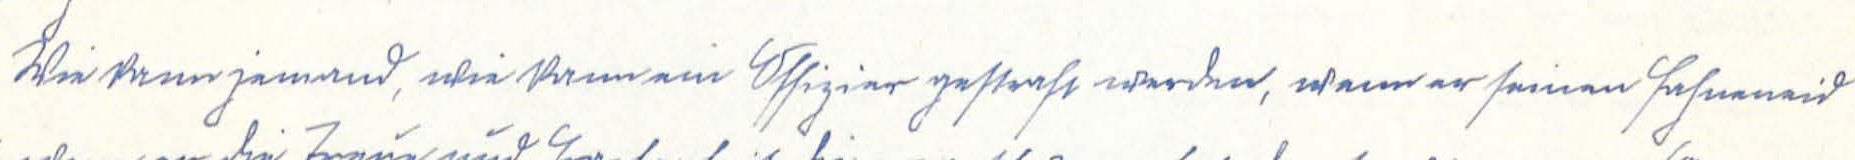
Wie kann jemand, wie kann ein Offizier gestraft werden, wenn er seinen Fahneneind
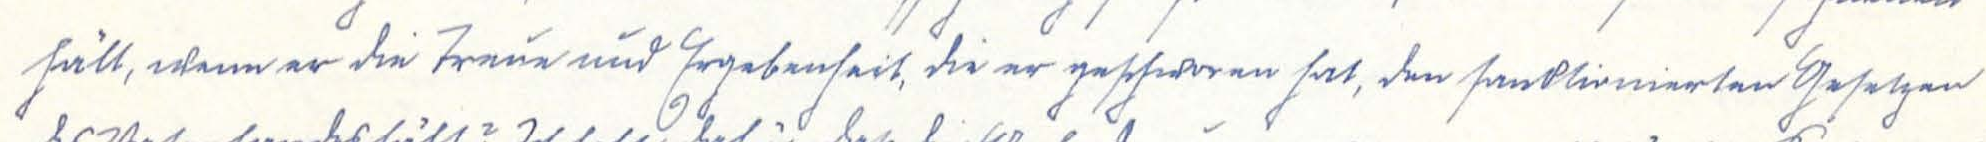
hält, wenn er die Treue und Ergebenheit, die er geschworen hat, den sanktionierten Gesetzen
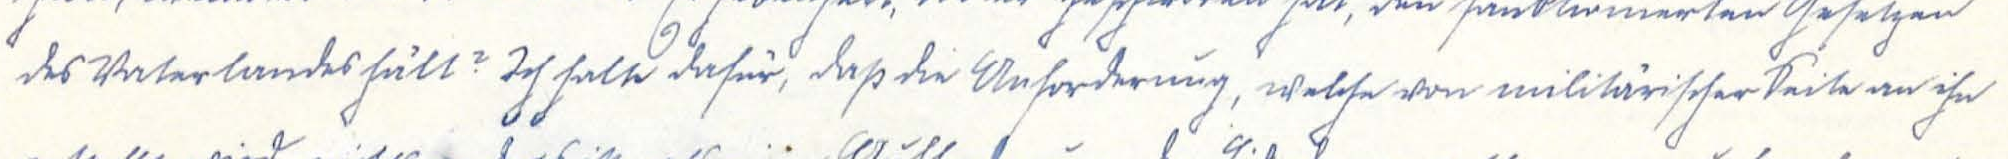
des Vaterlandes hält? Ich halte dafür, dass die Anforderung, welche von militärischer Seite an ihn
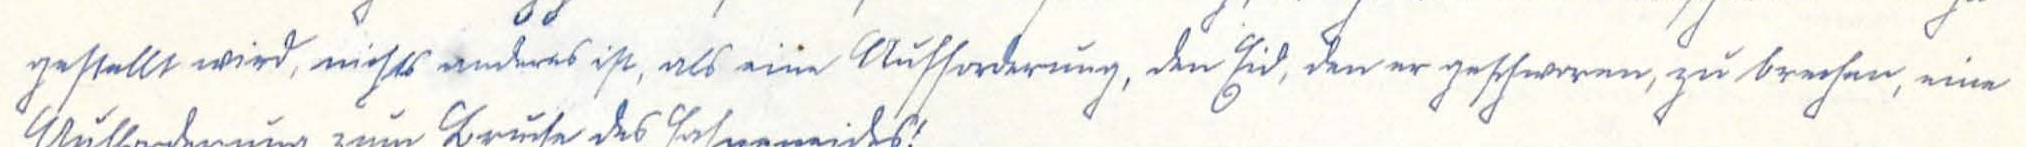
gestellt wird, nichts anderes ist, als eine Aufforderung, den Eid, den er geschworen, zu brechen, eine
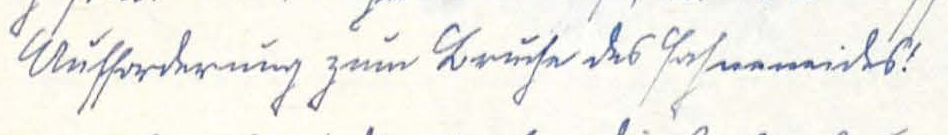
Auffoderung zum Bruche des Fahneneids!
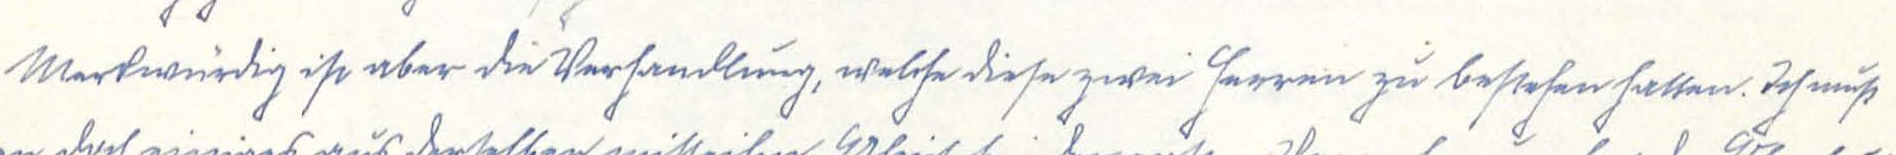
Merkwürdig ist aber die Verhandlung, welche diese zwei Herren zu bestehen hatten. Ich muß
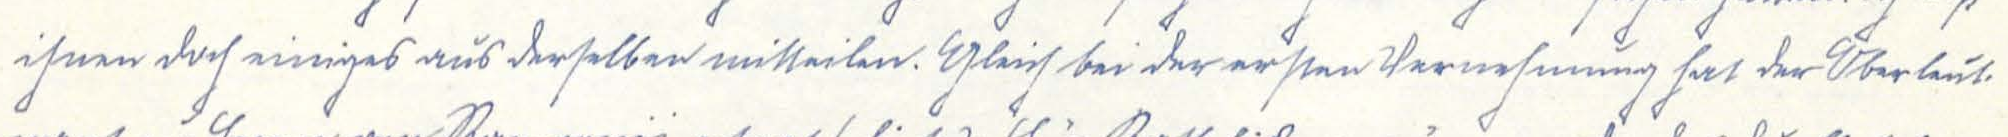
ihnen doch einiges aus derselben mitteilen. Gleich bei der ersten Vernehmung hat der Oberleut
